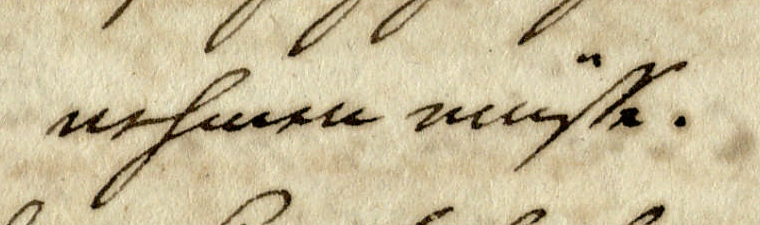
nehmen müsse.
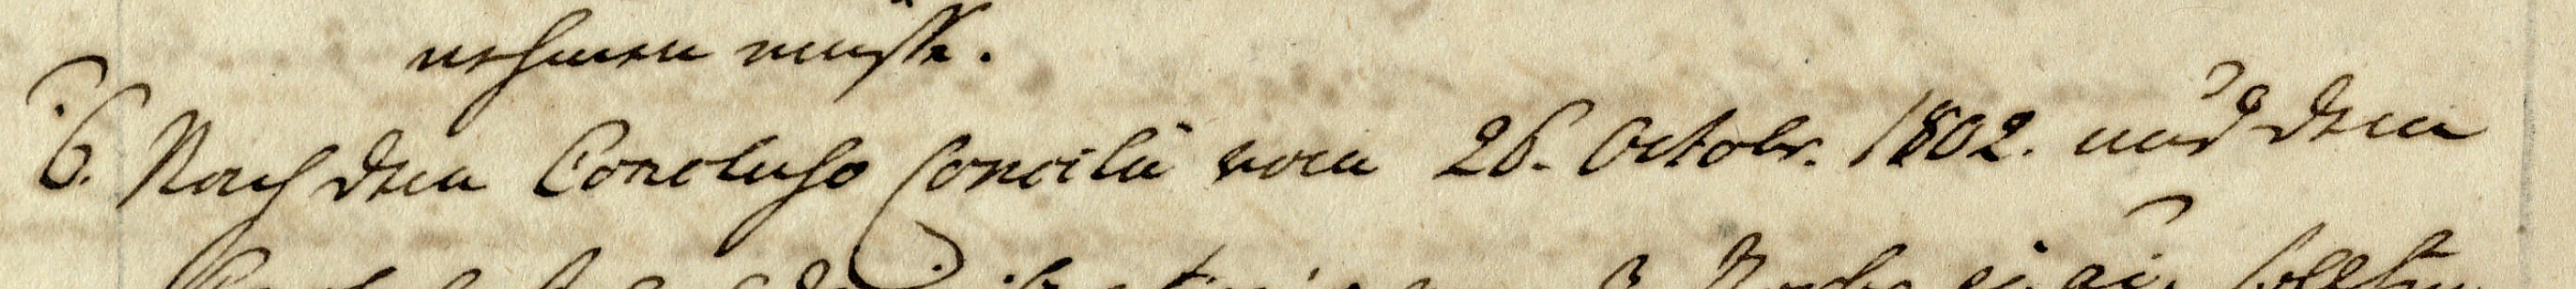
6. Nach dem Concluso Concilii vom 26. Octobr. 1802. und dem
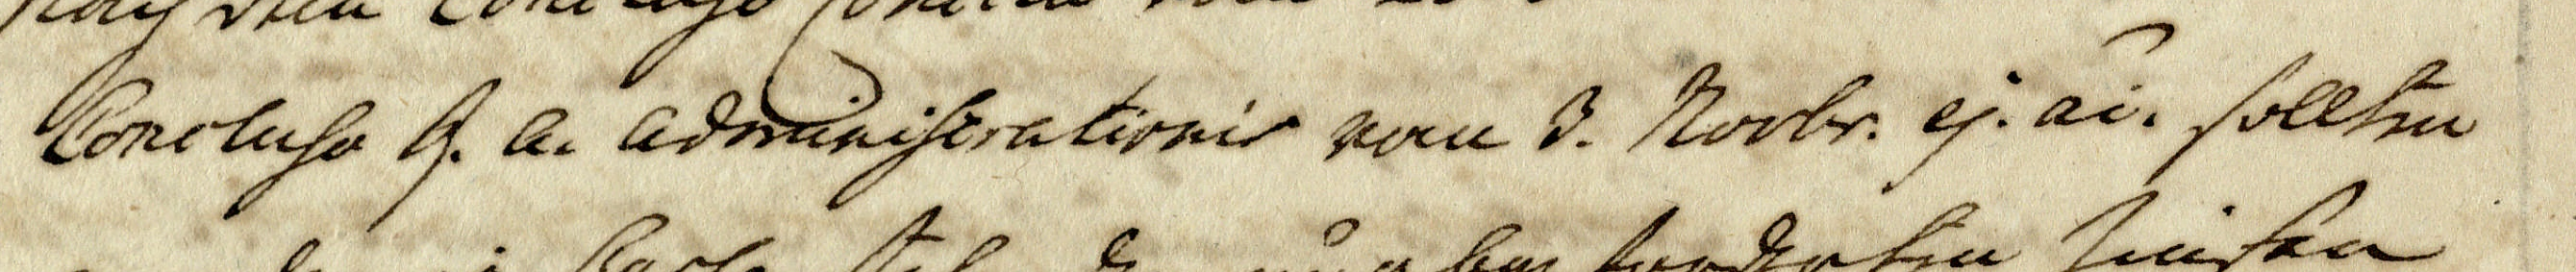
Concluso K. A. Administrationis vom 3. Novbr. ej. ai. sollten
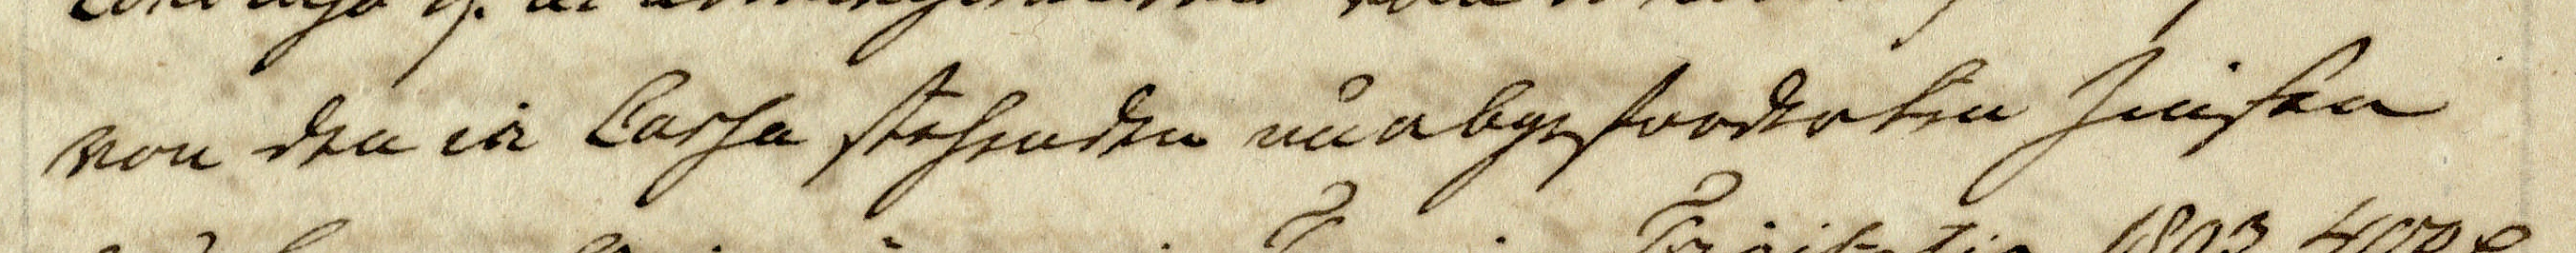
von den in Cassa stehenden unabgeforderten Zinsen
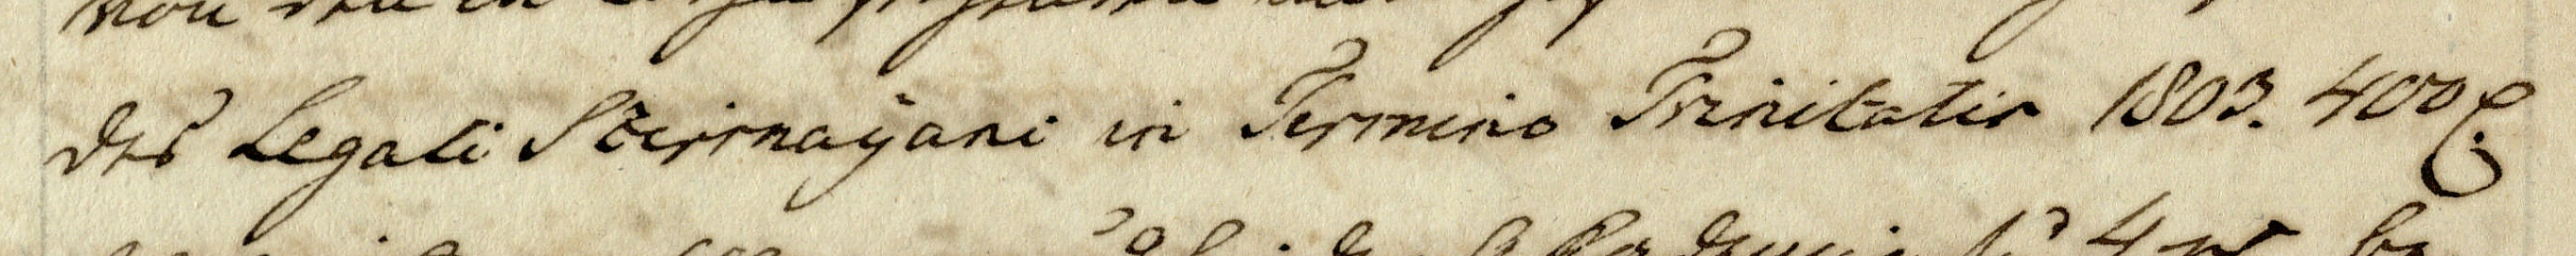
des Legati Szirmaÿani in Termino Trinitatis 18003. 400 l.
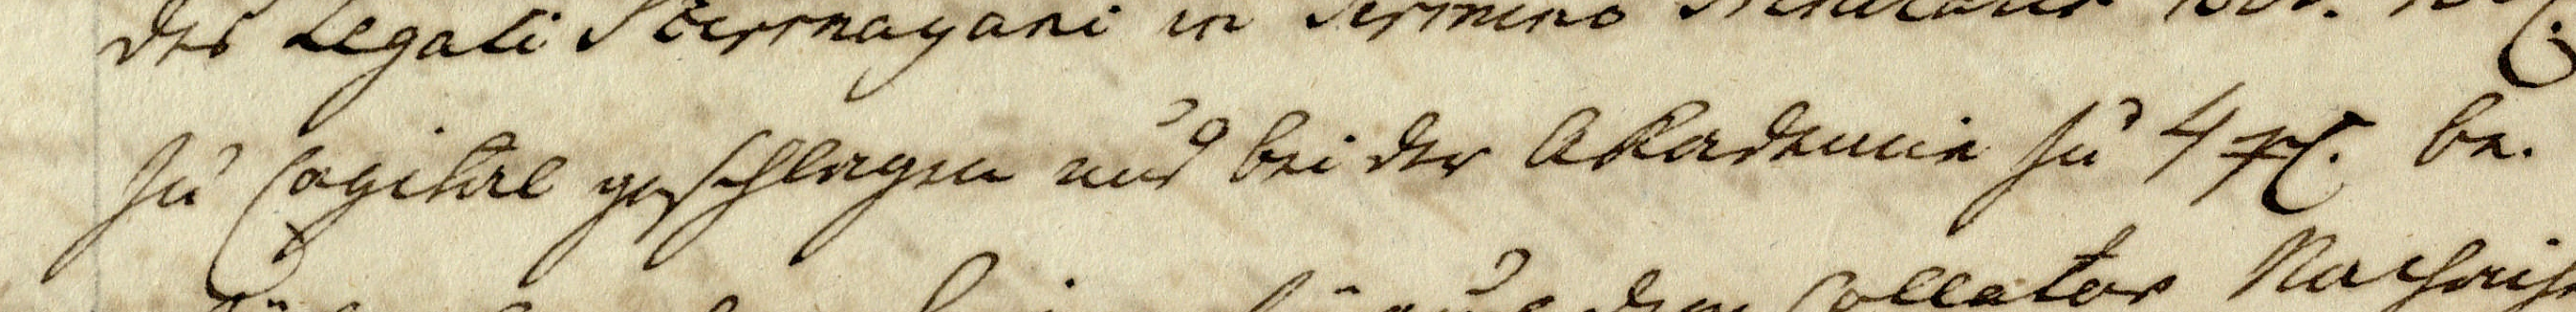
zu Capital geschlagen und bei der Akademie zu 4 pl. be¬
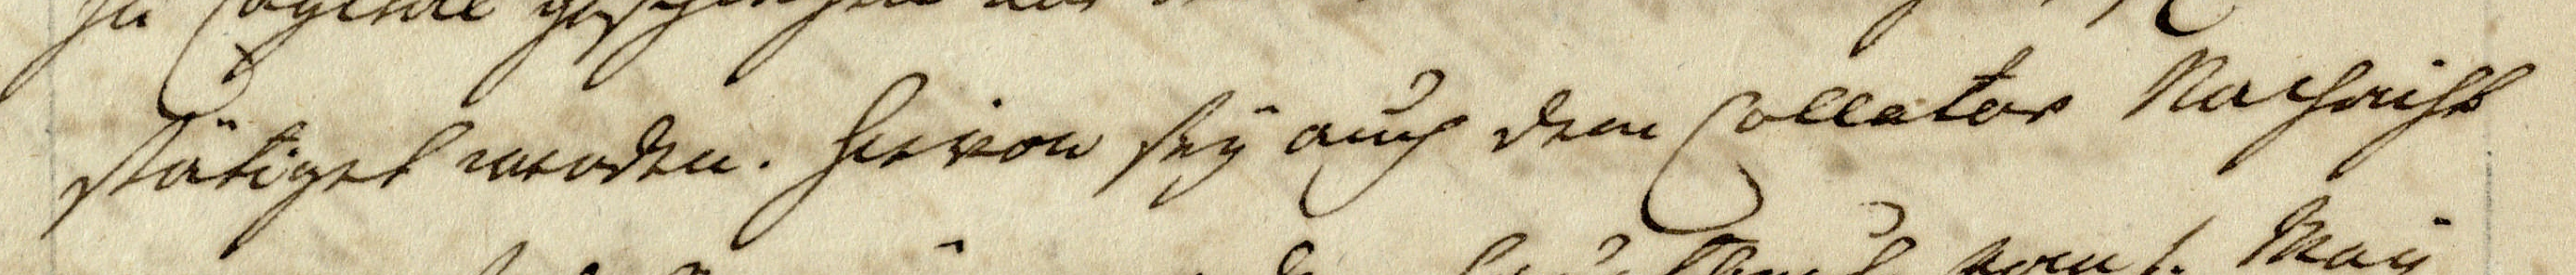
stätiget werden. Hievon seÿ auch dem Collator Nachricht
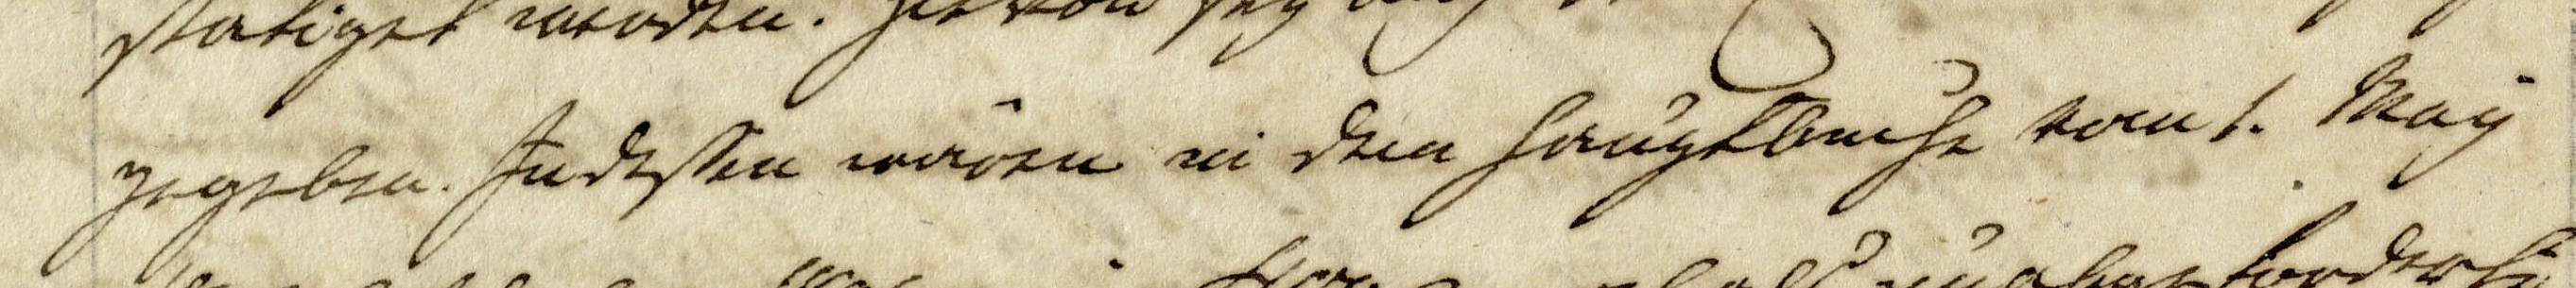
gegeben. Indessen wären in dem Hauptbuche vom 1. Maÿ
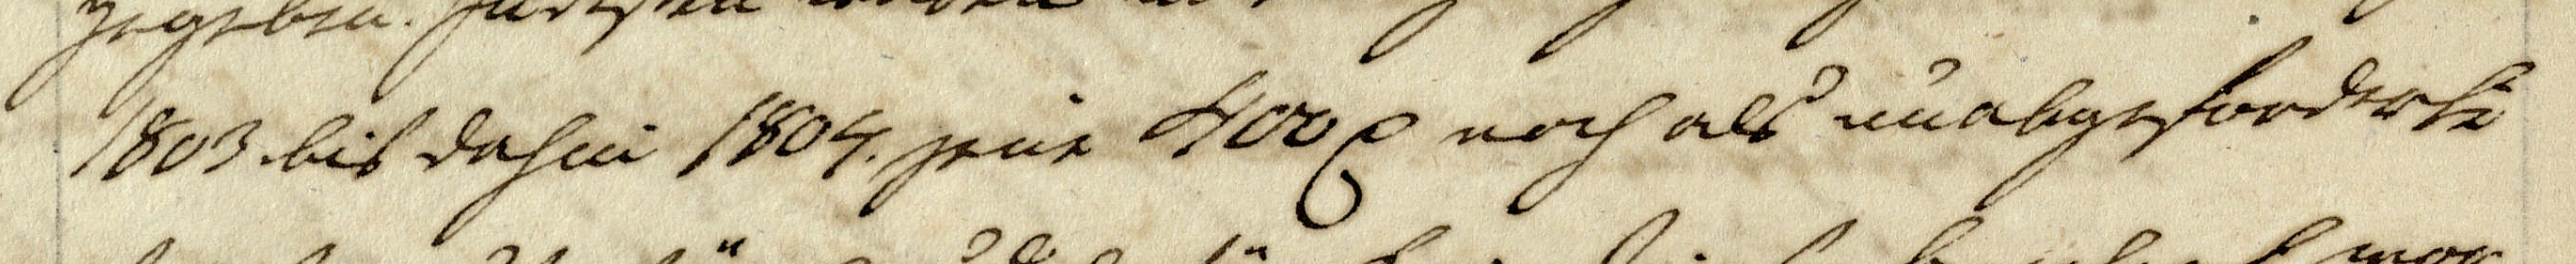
1803 bis dahin 1804. jene 400 l noch als unabgeforderte
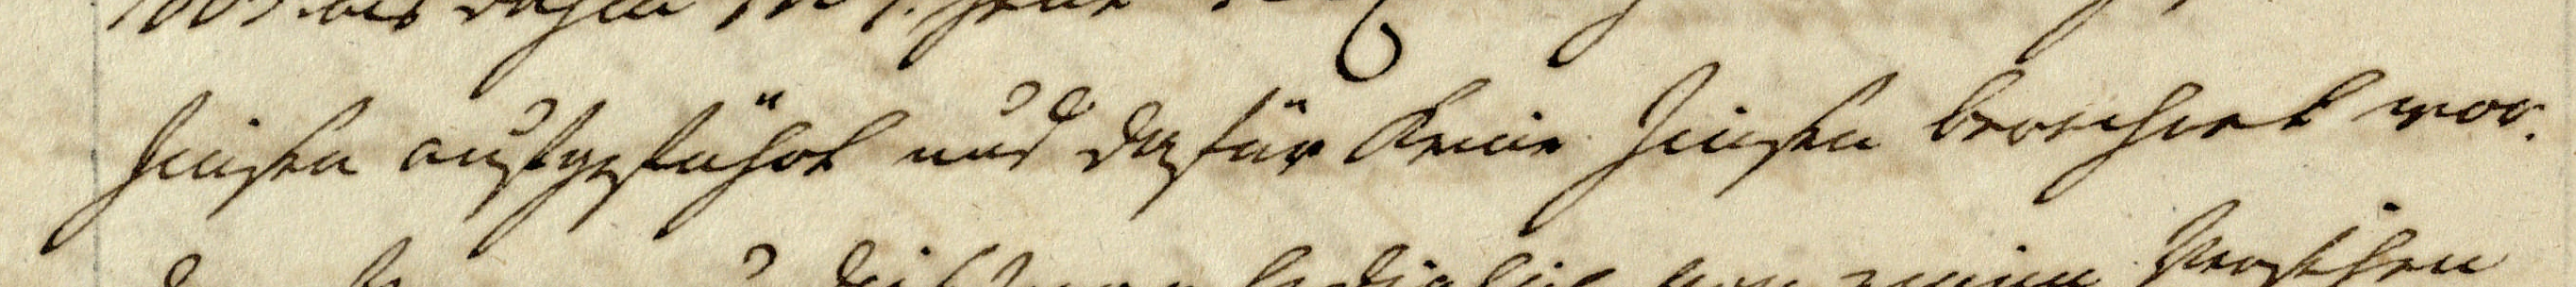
Zinsen aufgeführt und dafür keine Zinsen berechnet wor¬
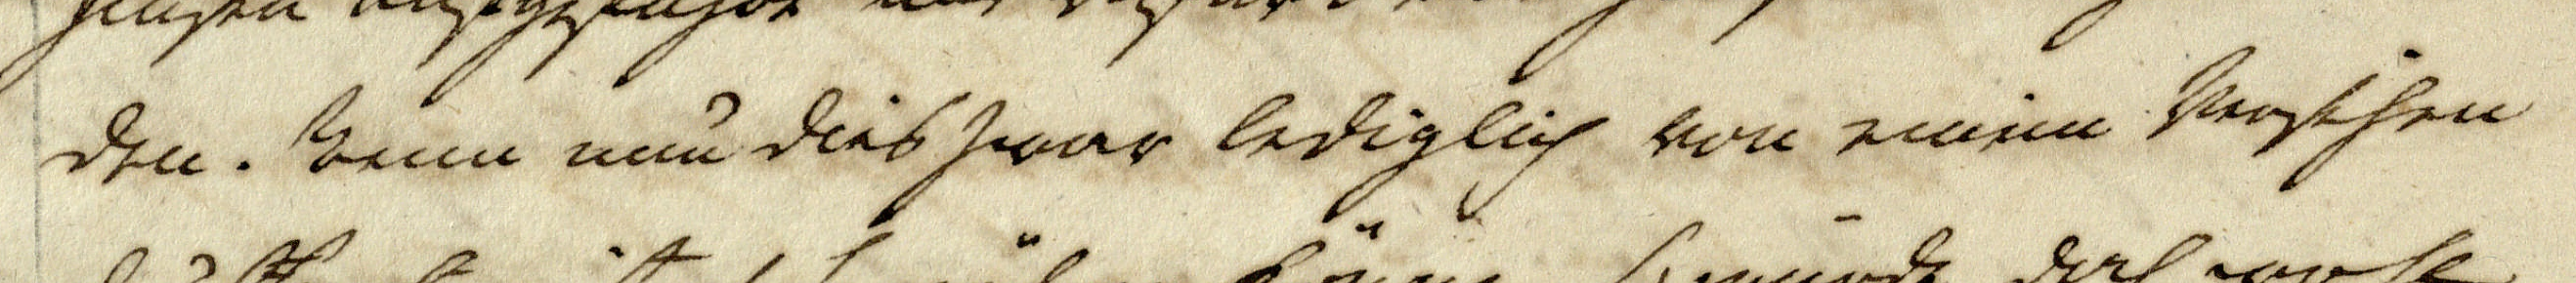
den. Wenn nun dies zwar lediglich von einem Versehen
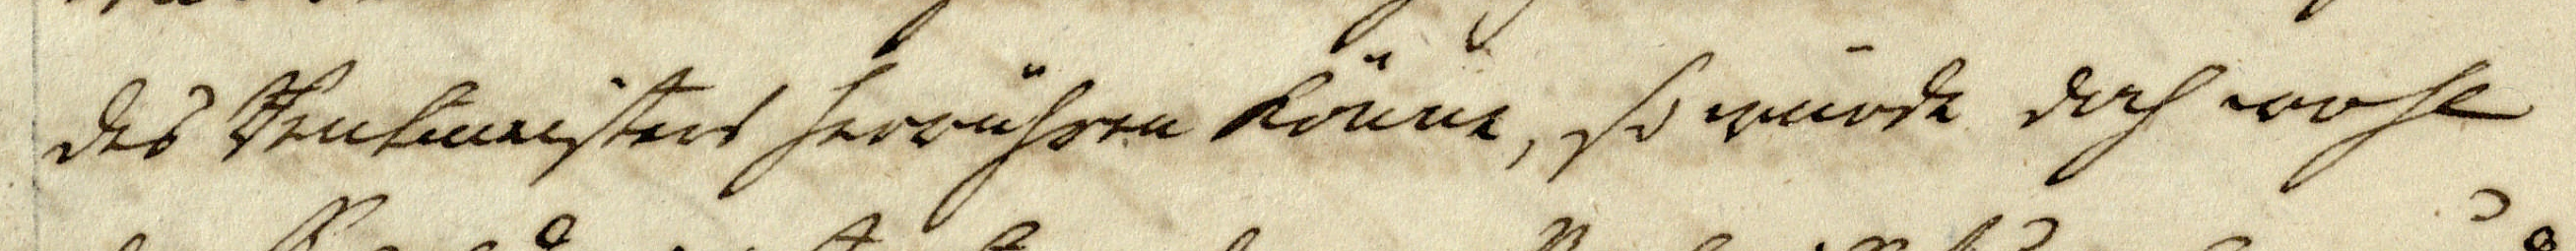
des Rentmeisters herrühren könne, so würde doch wohl
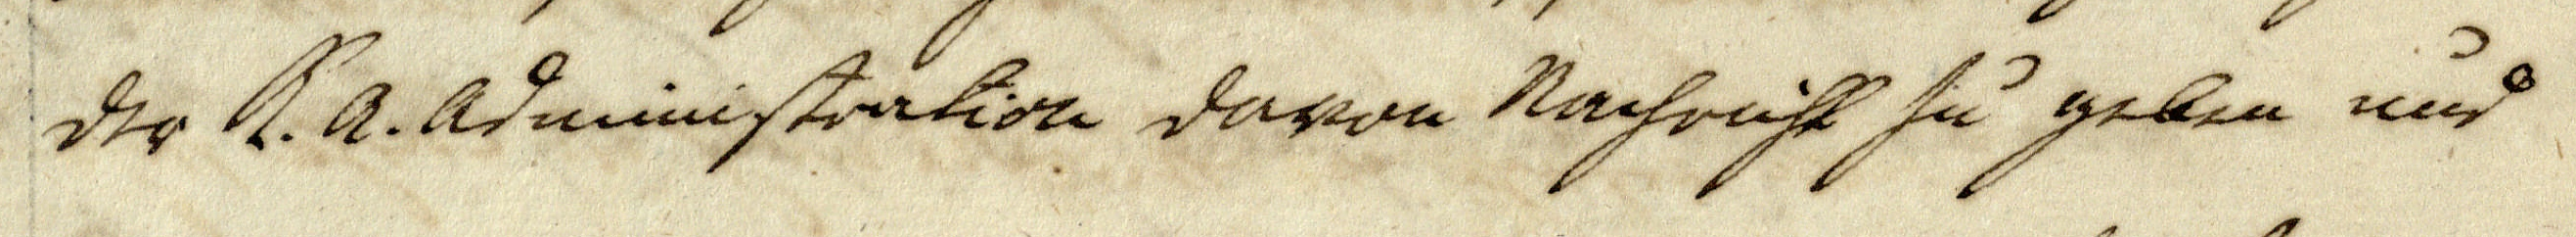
der K. A. Administration davon Nachricht zu geben und
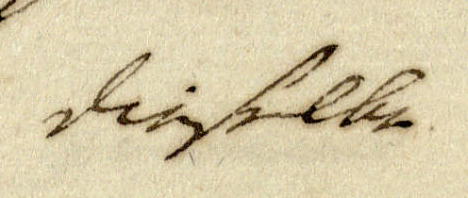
dieselbe
